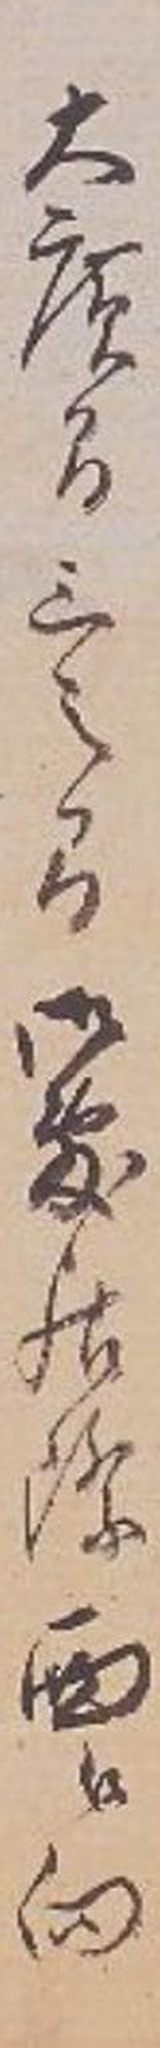大広間三之間御敷居際西え向
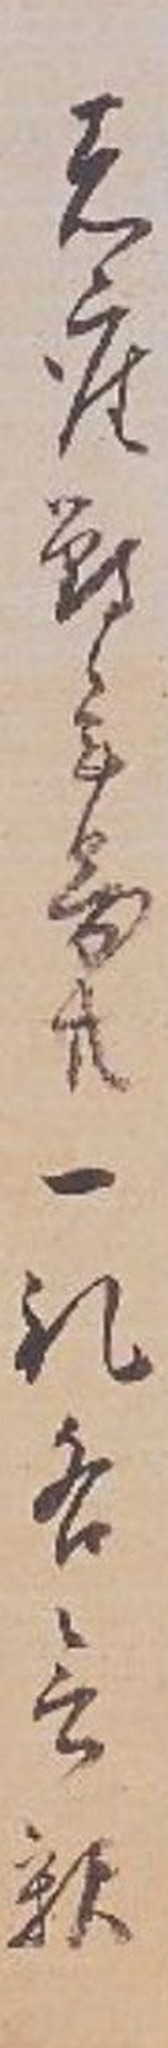着座対年寄共一礼各会釈
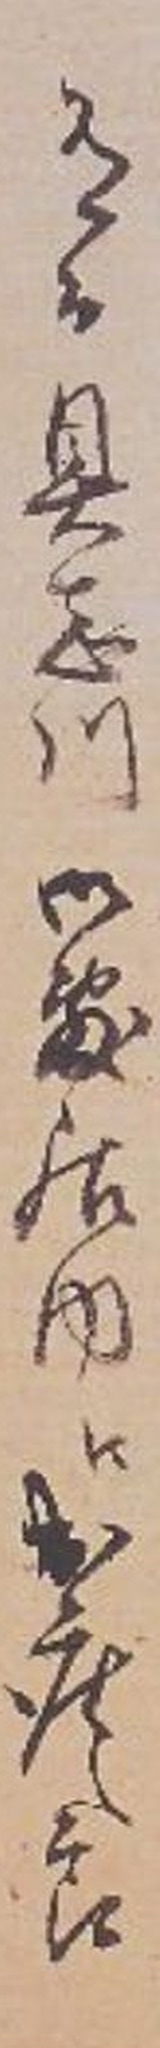有而具志川御敷居内え出座候節

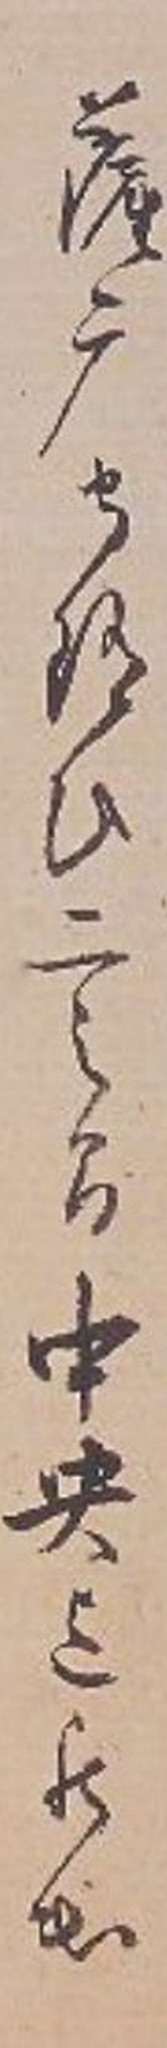薩摩守随ひ二之間中央迄罷出
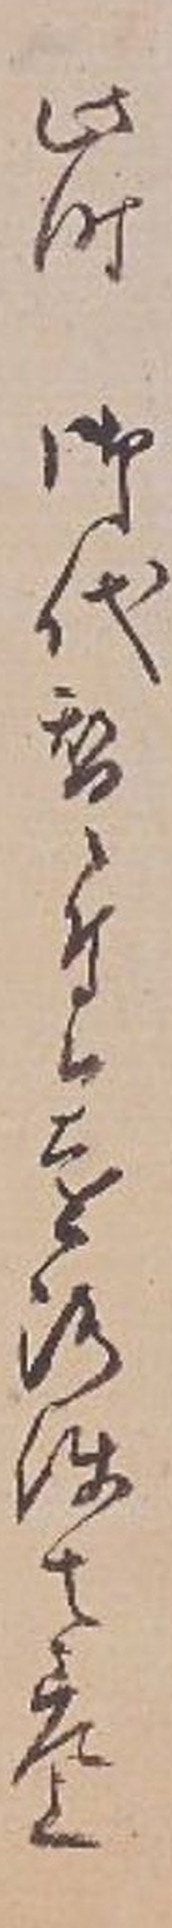此時御代替に付而遠路使者差上
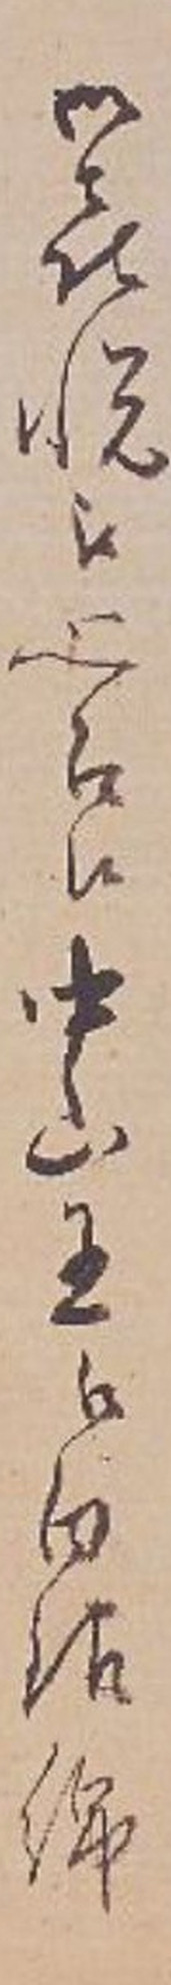御喜悦被思召候山中王え白銀綿
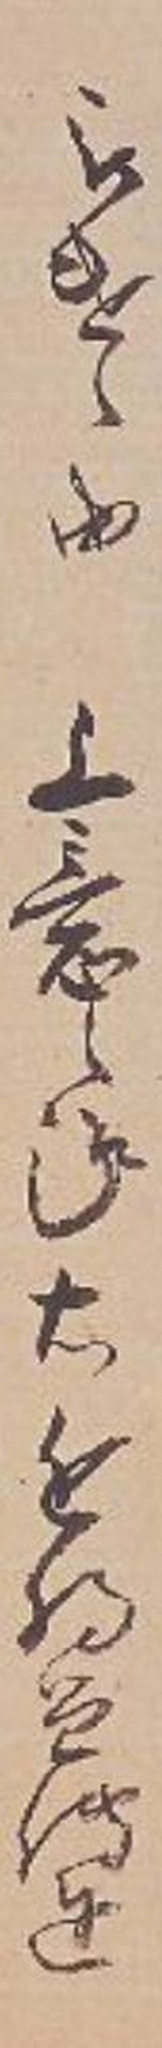被遣候由上意之趣右近将監伝達
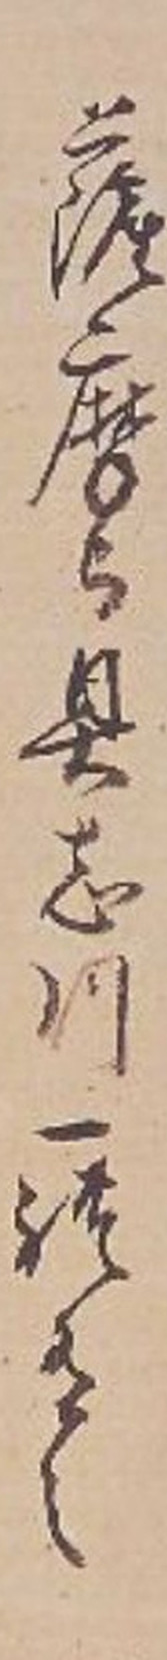薩摩守具志川一礼有之
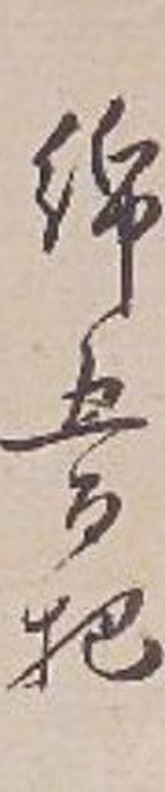綿五百把
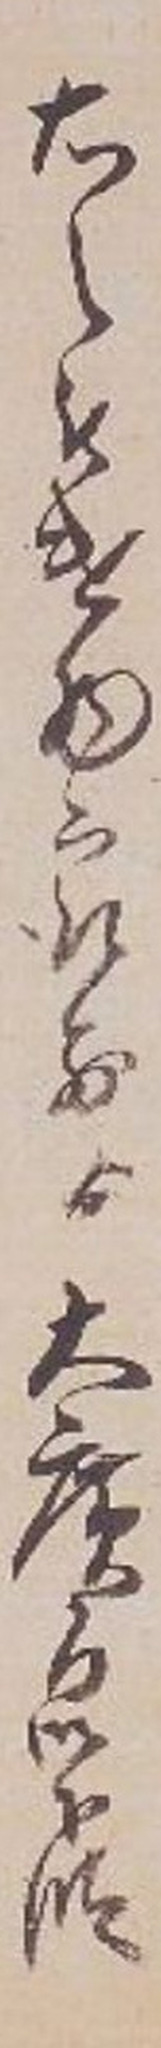右之被遣物君前ゟ大広間御下段
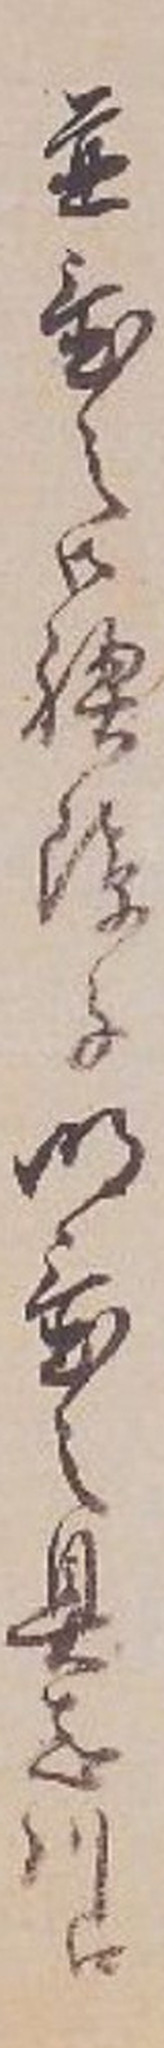並置之襖障子明置之具志川え
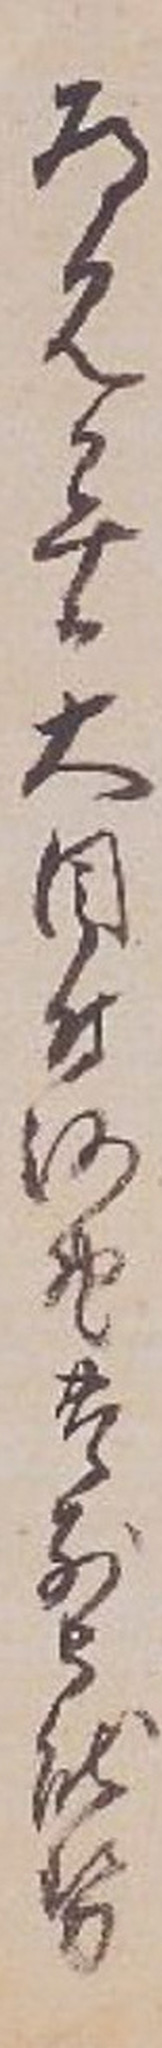為見畢而大目付河野豊前守能勢
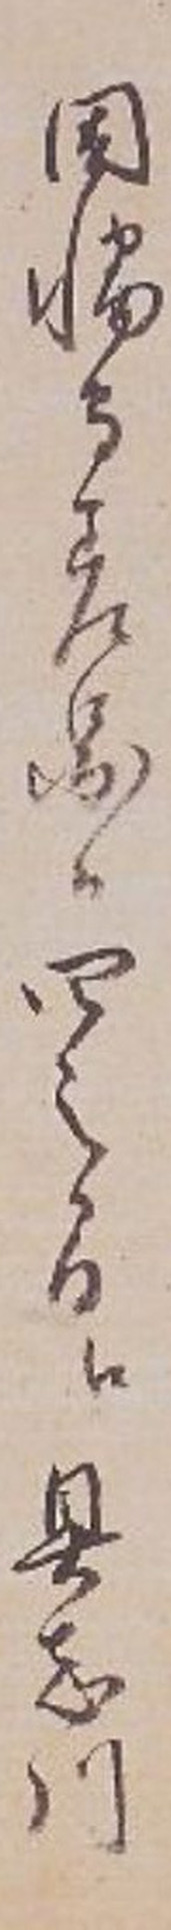因幡守差図而四之間え具志川
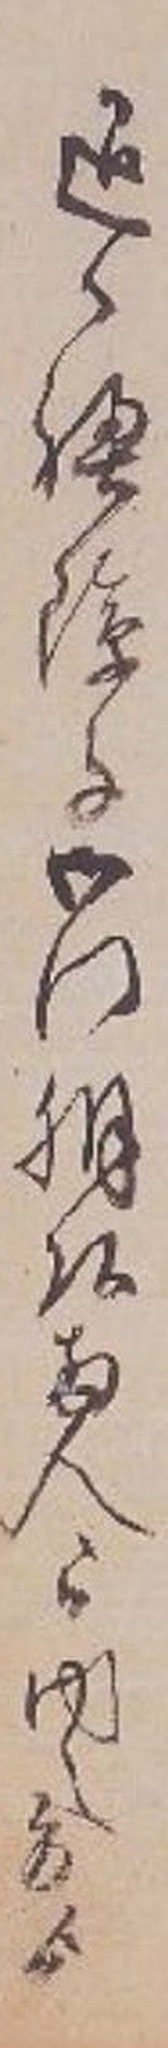退御襖障子御同朋頭両人に而内之方ゟ

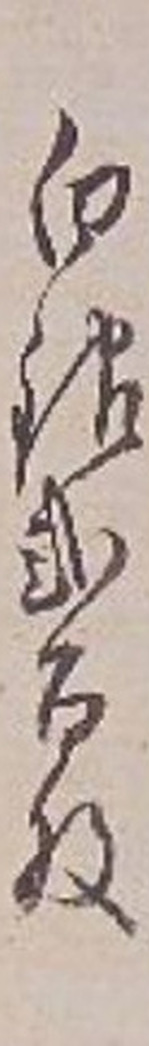白銀弐百枚
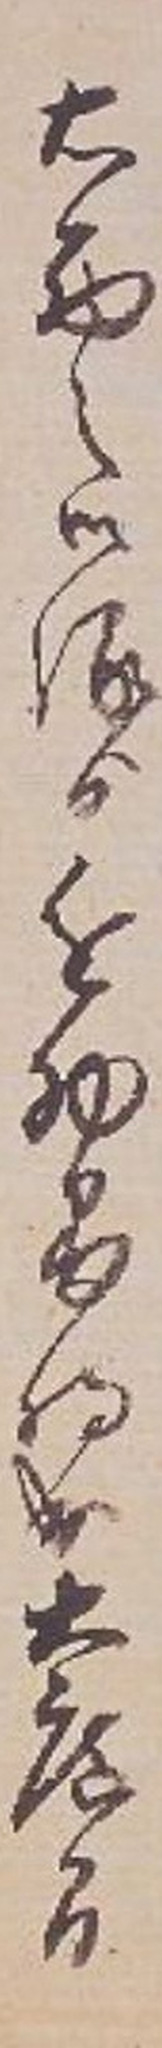右西之御縁ゟ進物番持出大広間
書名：琉球人来朝記 八、九
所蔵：University of the Ryukyus Library
